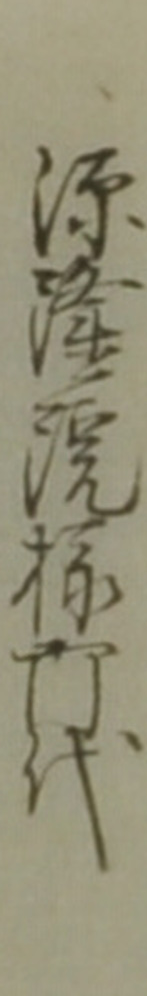源隆院様御代
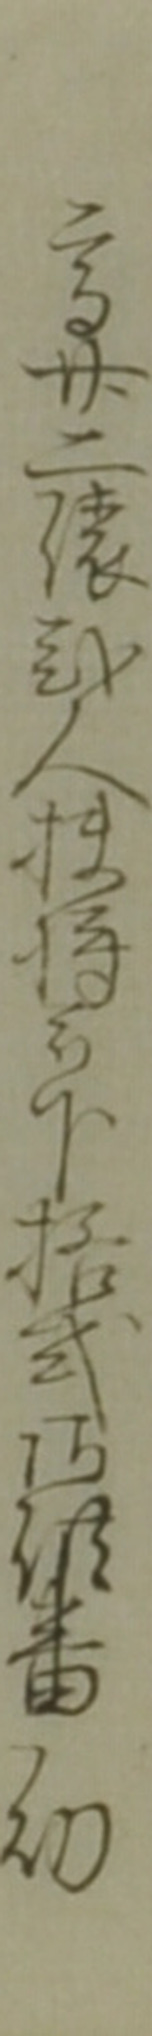高廿二俵弐人扶持被下格式御供番幼
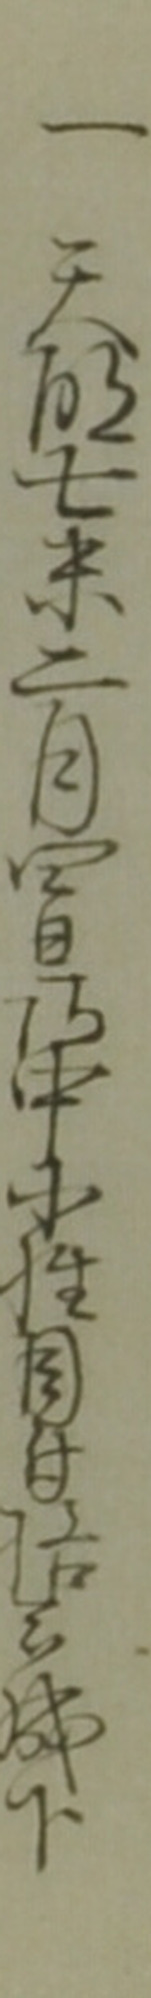一天明七未二月四日御中小性目付格被成下
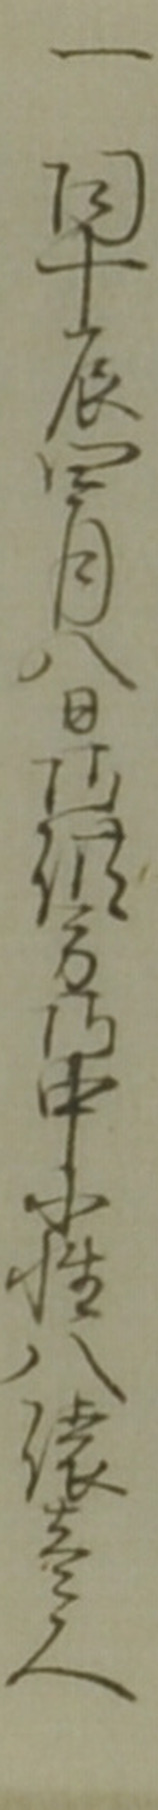一同十辰四月八日御供方御中小性八俵壱人
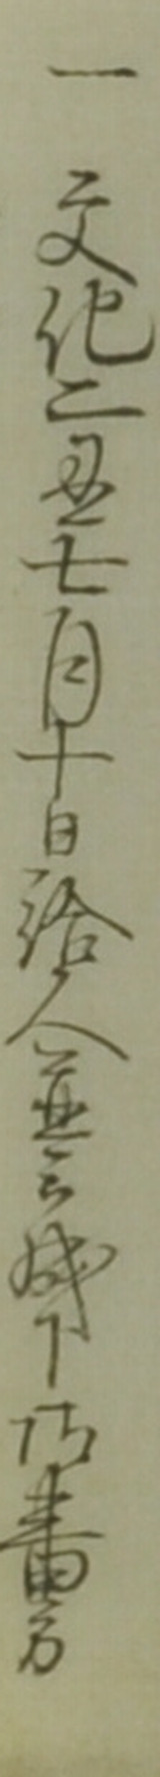一文化二丑七月十日給人並被成下御番方

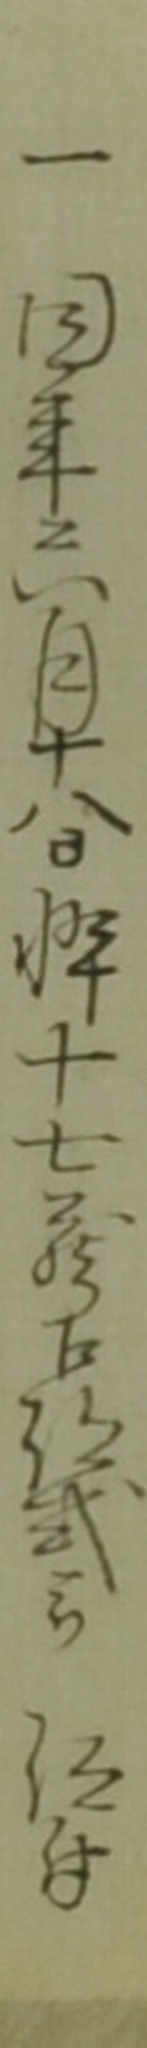一同年六月十八日忰十七蔵御江跡式被仰付
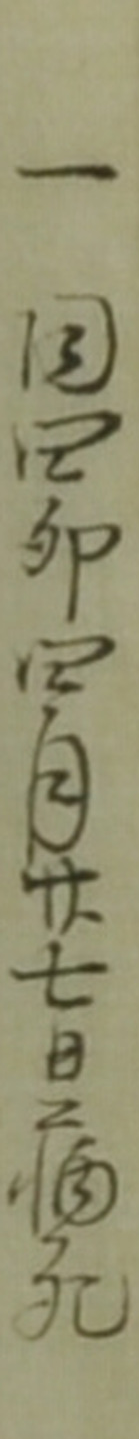一同四卯四月廿七日病死
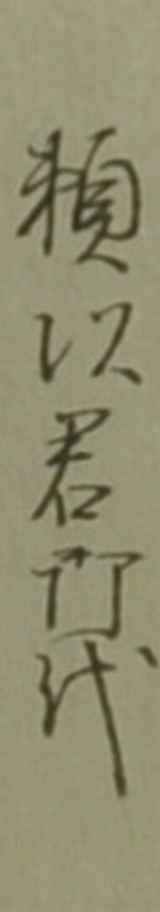頼以君御代
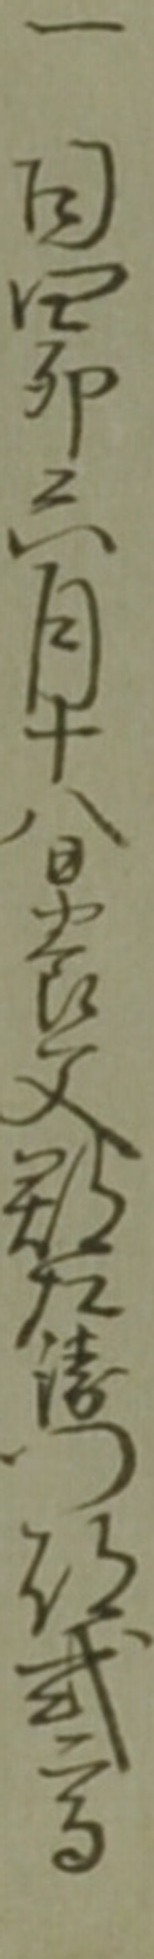一同四卯六月十八日養父郡左衛門跡式高
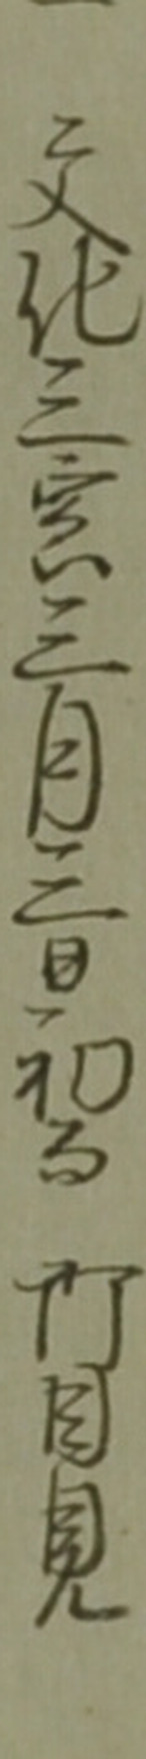一文化三寅三月三日初而御目見
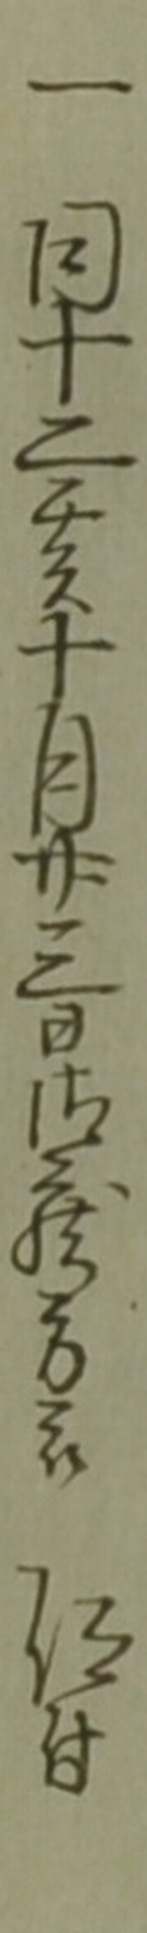一同十二亥十月廿三日御蔵方被仰付
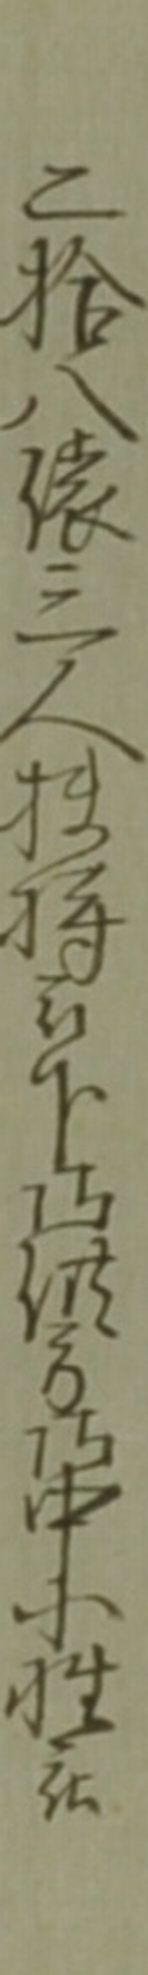二拾八俵三人扶持被下御供方御中小性被
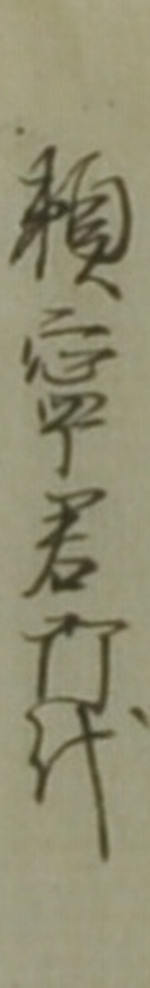頼寧君御代
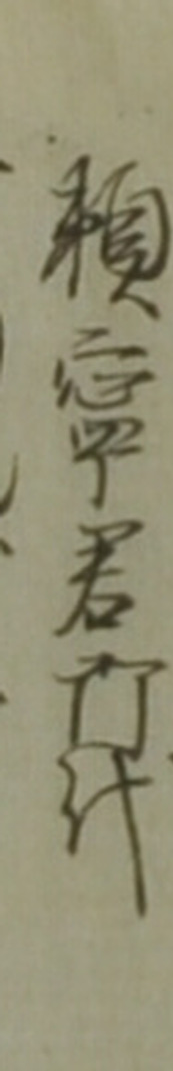頼寧君御代
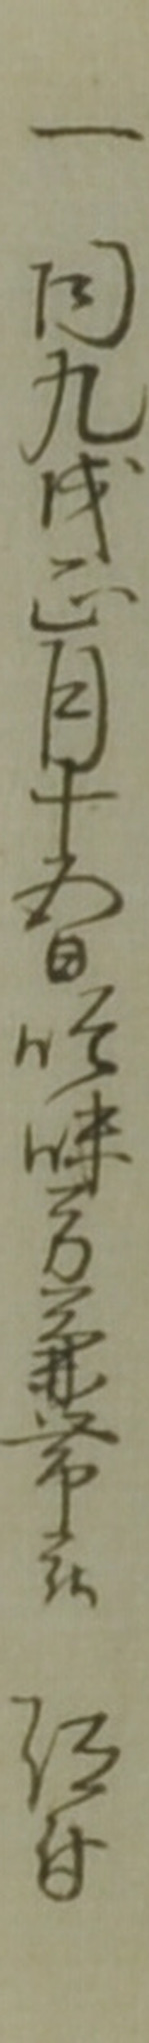一同九戌正月十五日吟味方兼帯被仰付
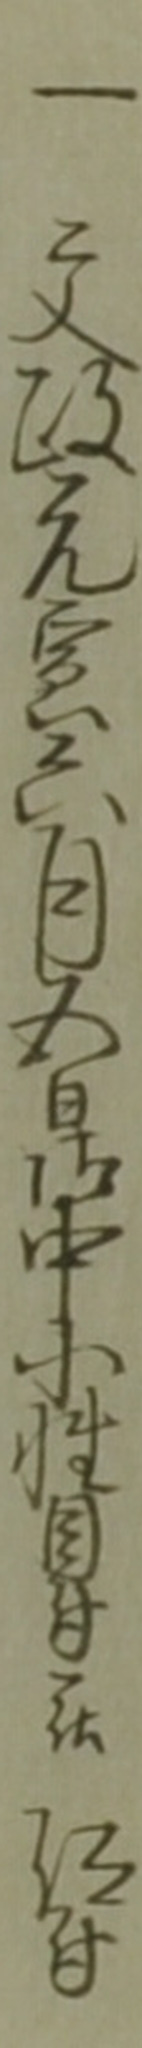一文政元寅六月五日御中小性目付被仰付
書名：無足諸士勤仕録（一）
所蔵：伊那市立高遠町図書館・合同会社AMANE
